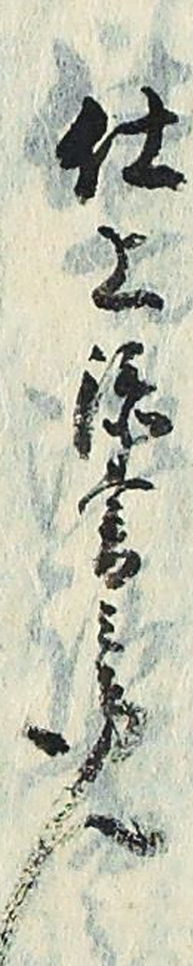仕上添書之覚
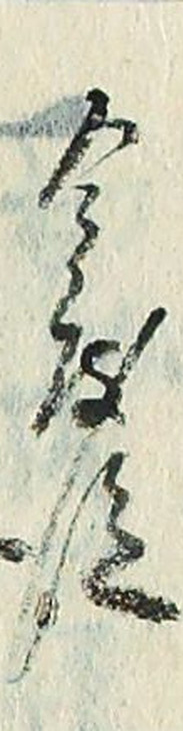今度従
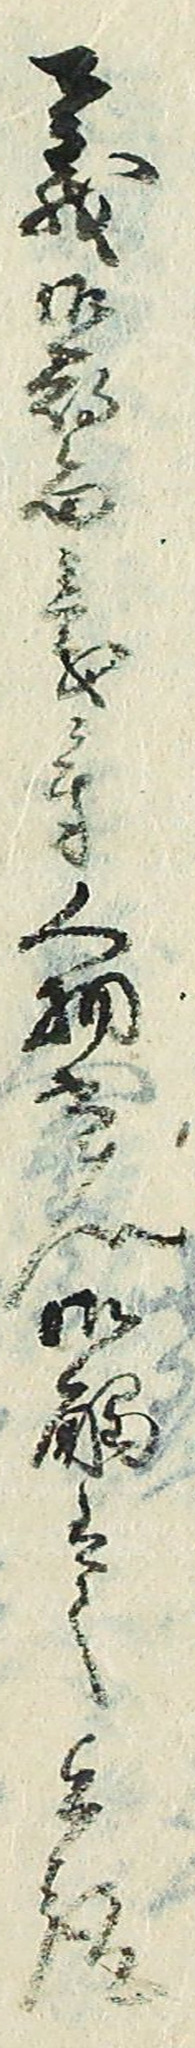公義御尋者之義に付人相書を以御触有之候趣
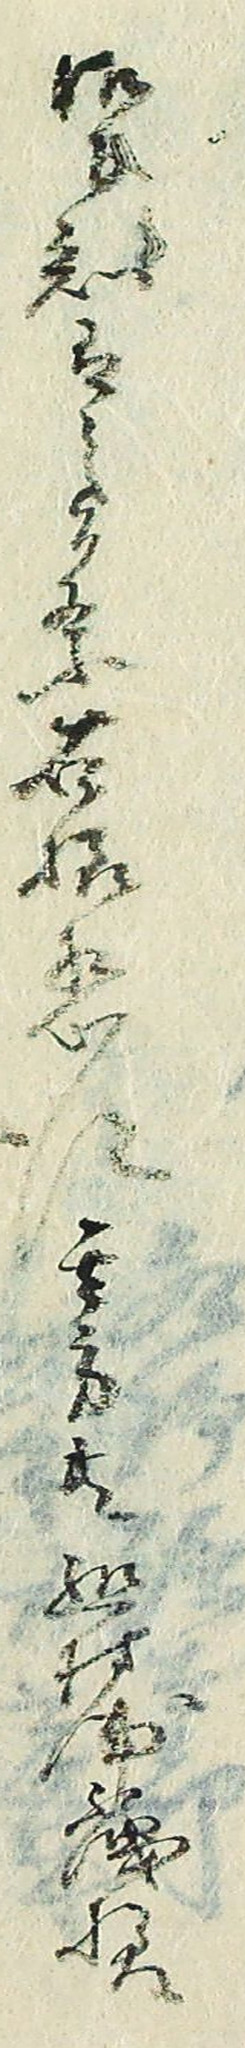御下知有之候条右様相心得其方共組村浦不洩様
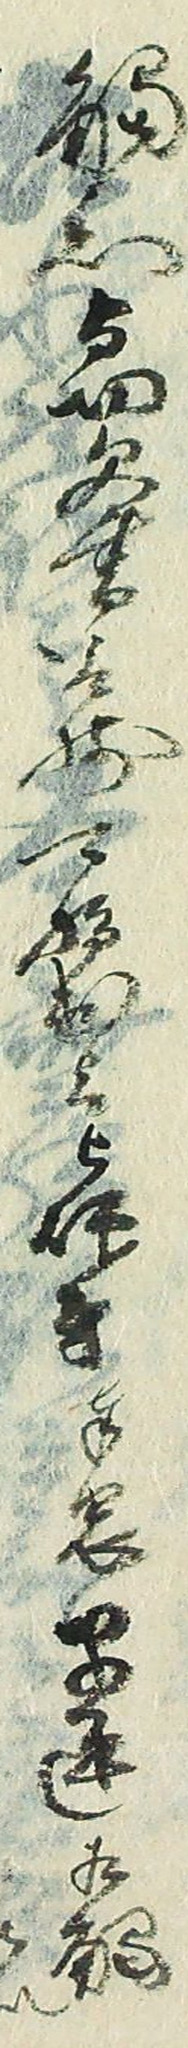触知与切受書取揃可指出候旨被仰付奉畏早速相触候処
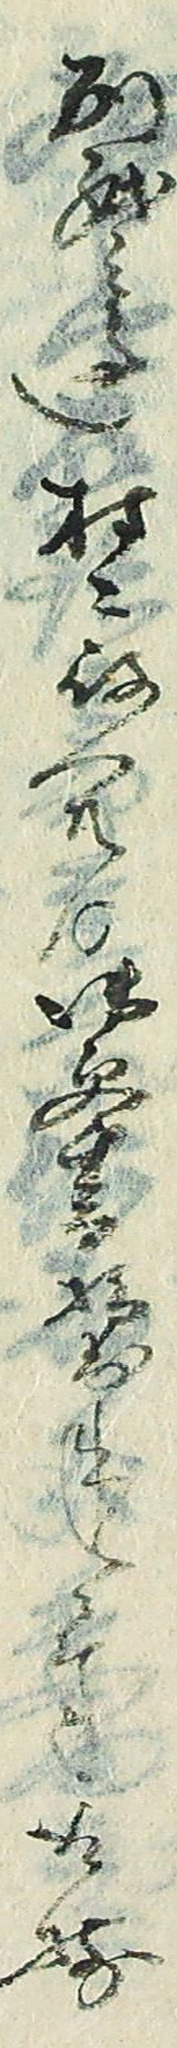別紙之通村々役人共ゟ御受書指出来候に付取揃
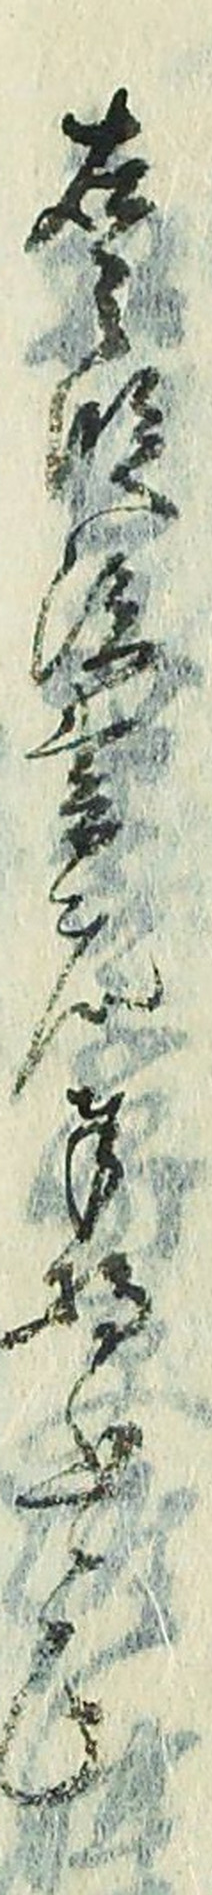右之段添書を以奉指上候以上
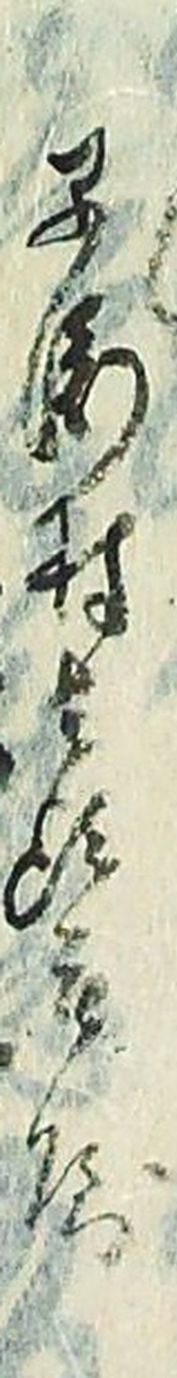早渕村与頭庄屋
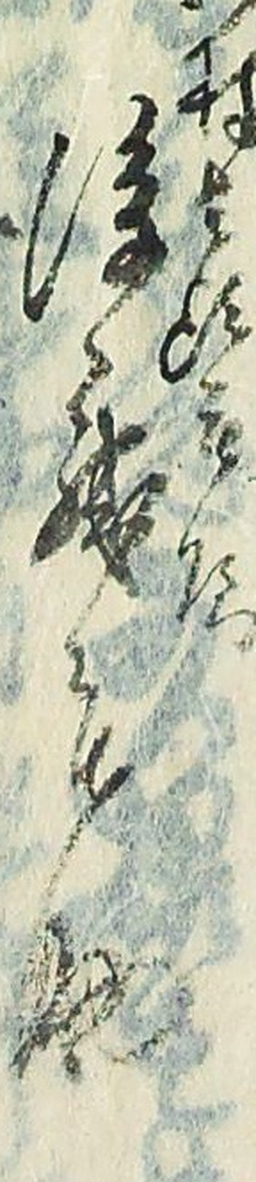後藤庄助
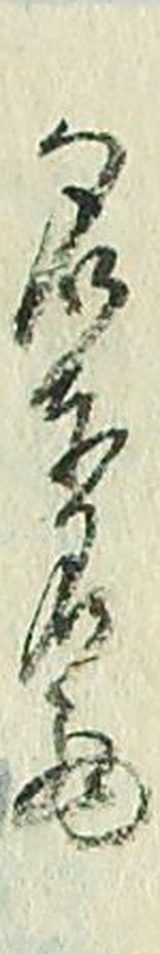名東名西
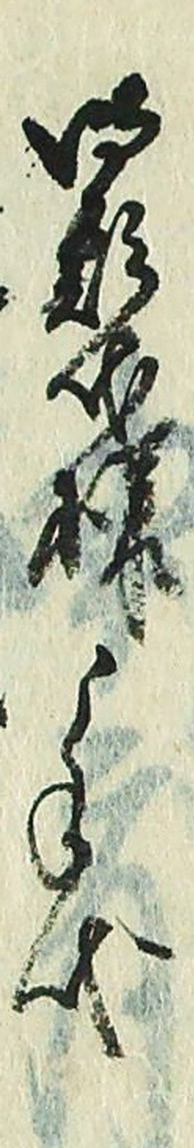御郡代様御手代
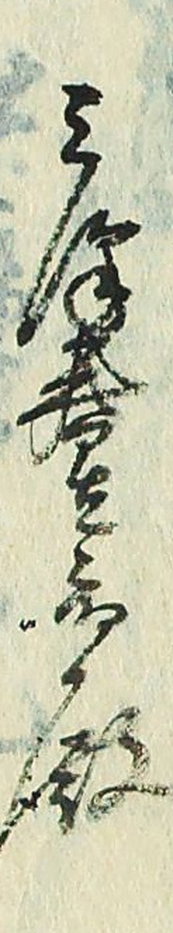三沢春太郎殿
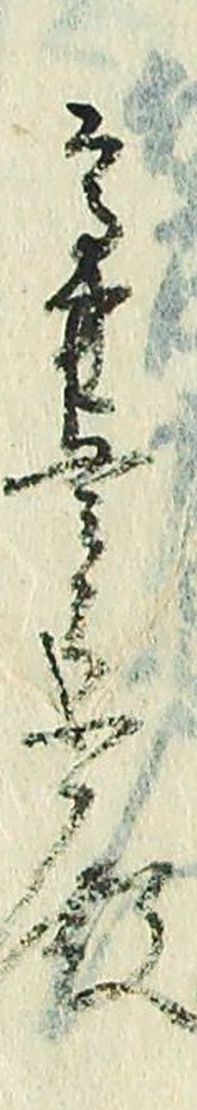高井与三兵衛殿
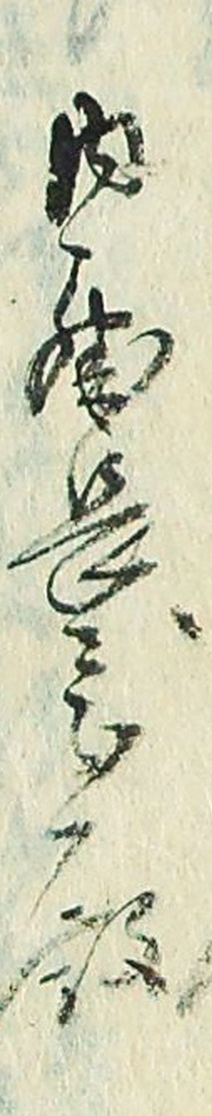内藤長三郎殿
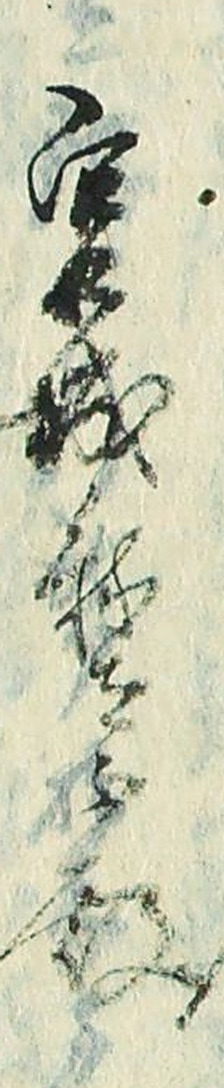宮城麻太郎殿

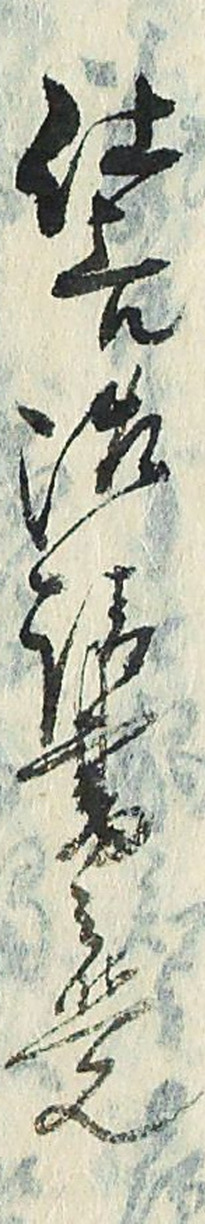仕上ル御請書之覚
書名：諸御用御□受書控
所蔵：鳴門教育大学 Naruto University of Education
